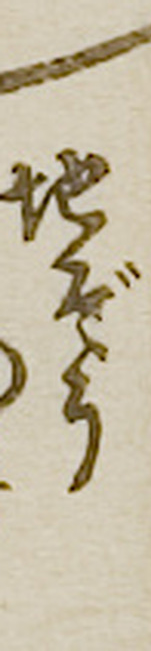地ぞう
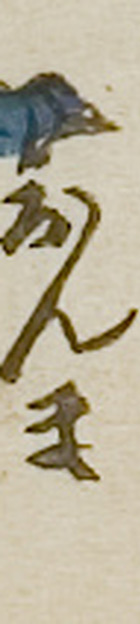えんま
